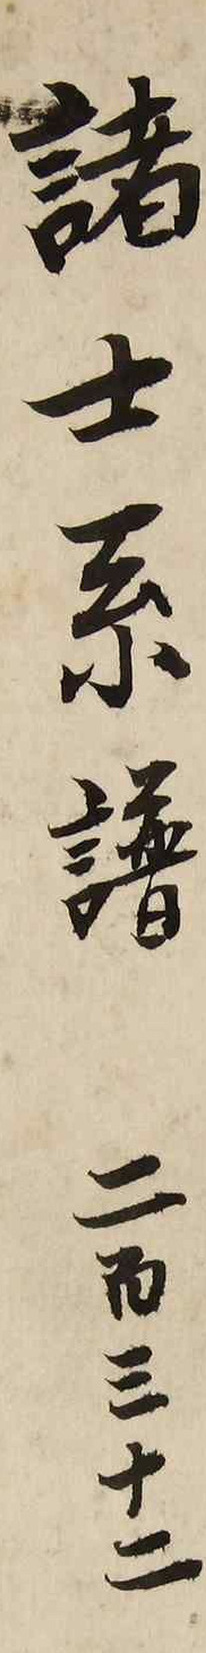諸士系譜二百三十二

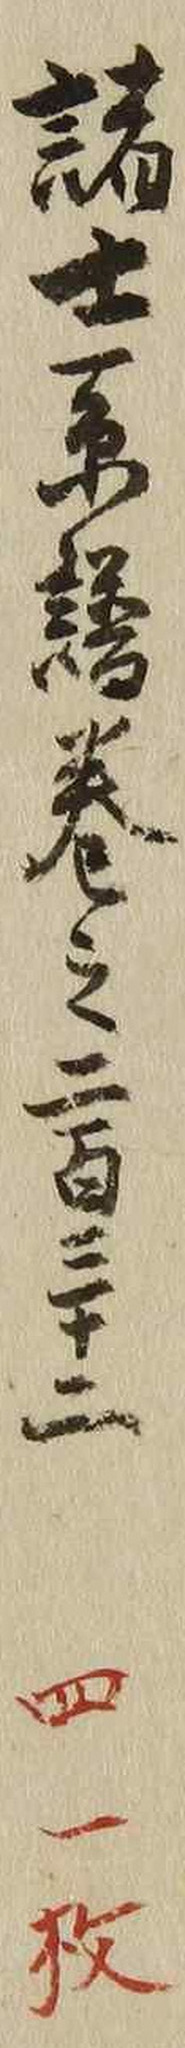諸士系譜巻之二百三十二四一枚
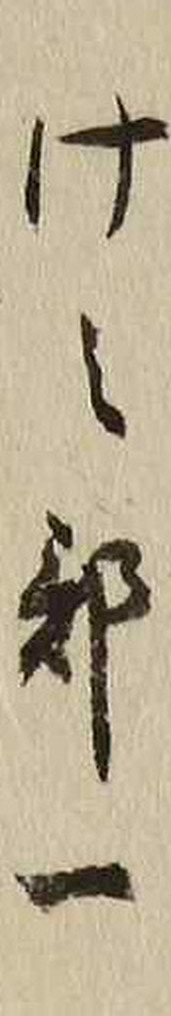け之部一
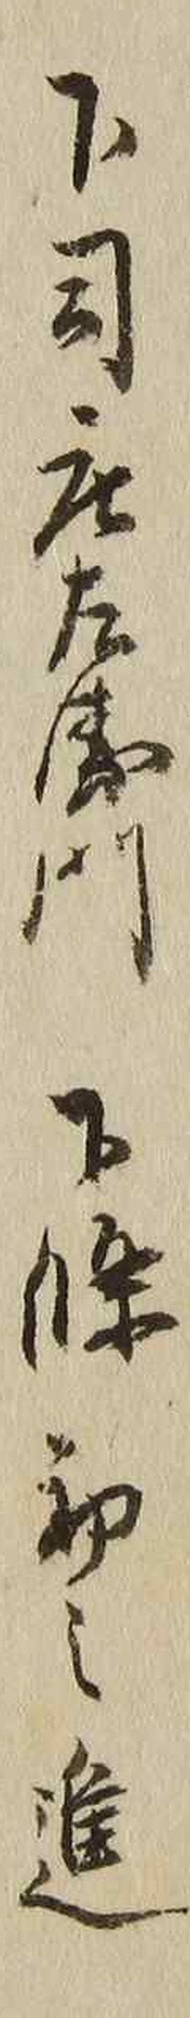下司庄左衛門下条初之進

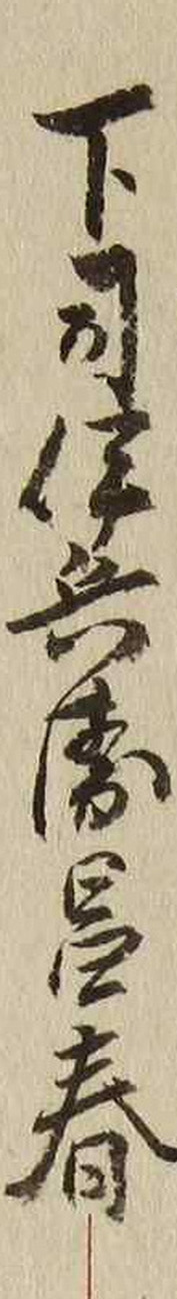下司伊兵衛昌春
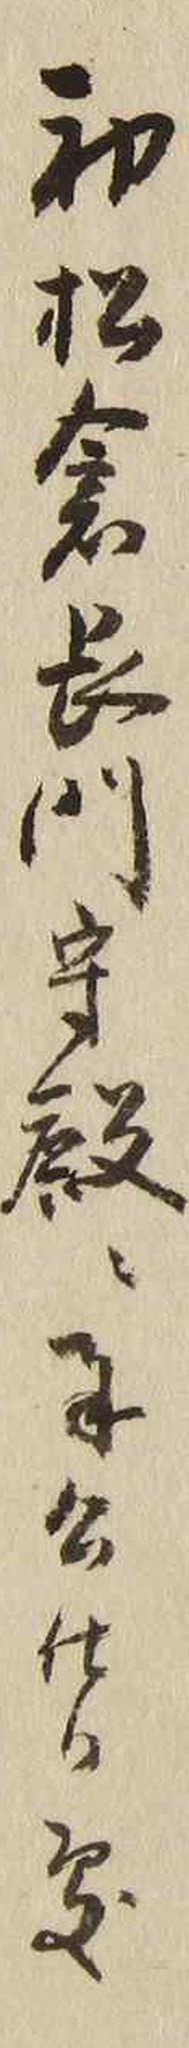初松倉長門守殿ニ奉公仕候処
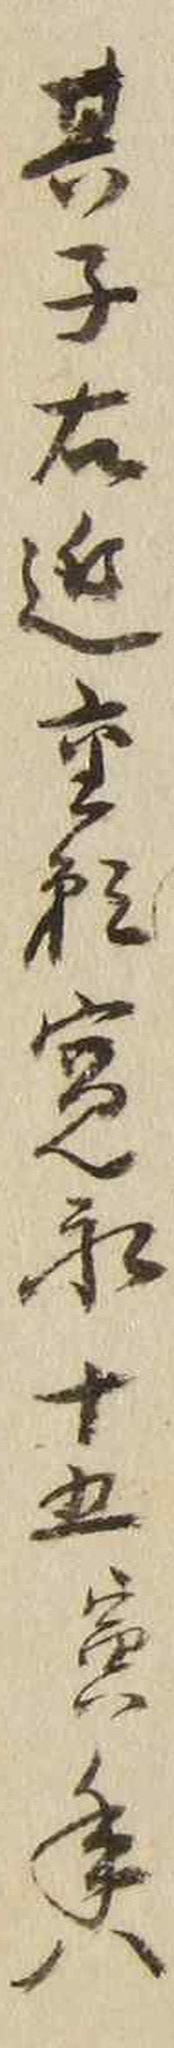其子右近重頼寛永十五寅年八

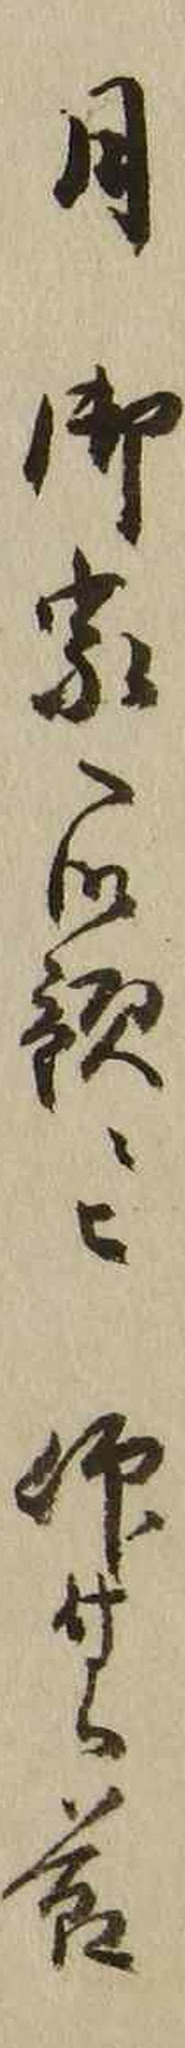月御家へ御預ニ被仰付候節
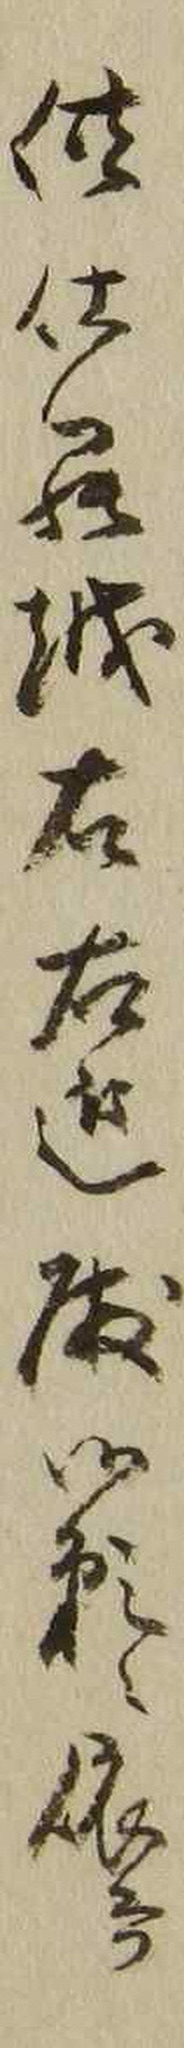供仕罷越右右近殿御頼ニ依而
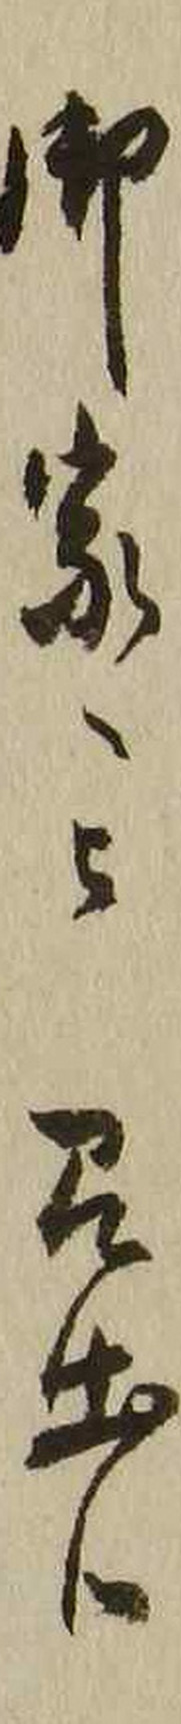御家へ被召出候
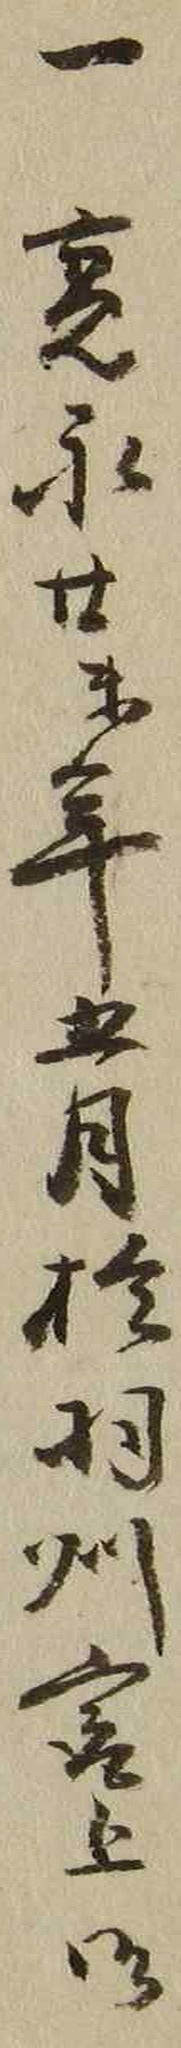一寛永廿未年五月於羽州最上御
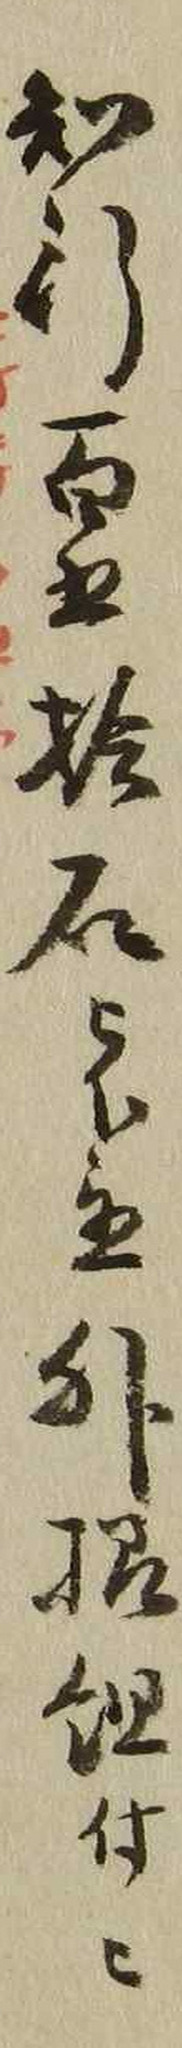知行百五拾石被下置外様組付被
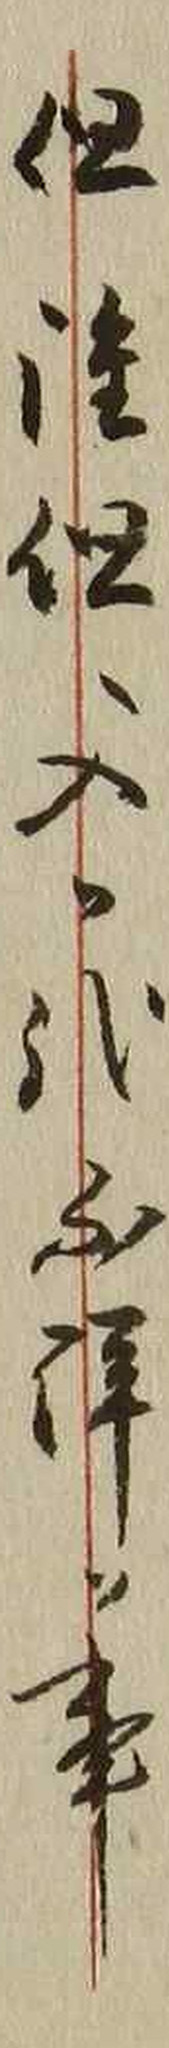但誰組へ入候哉不詳候事
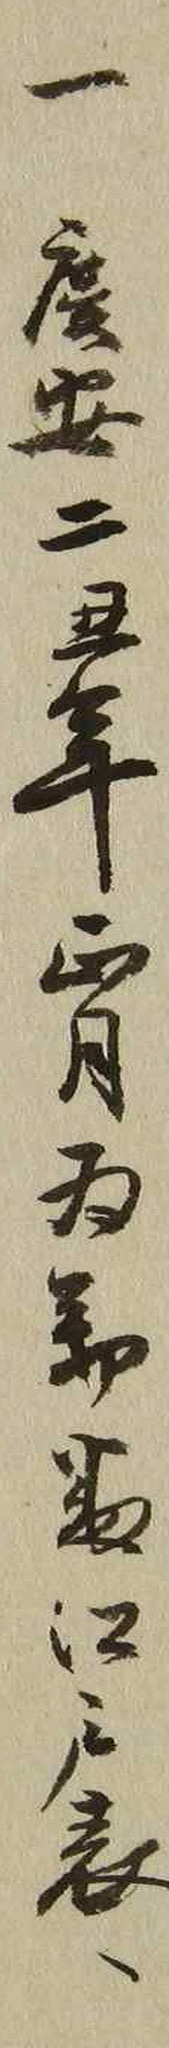一慶安二丑年正月為勤番江戸表へ
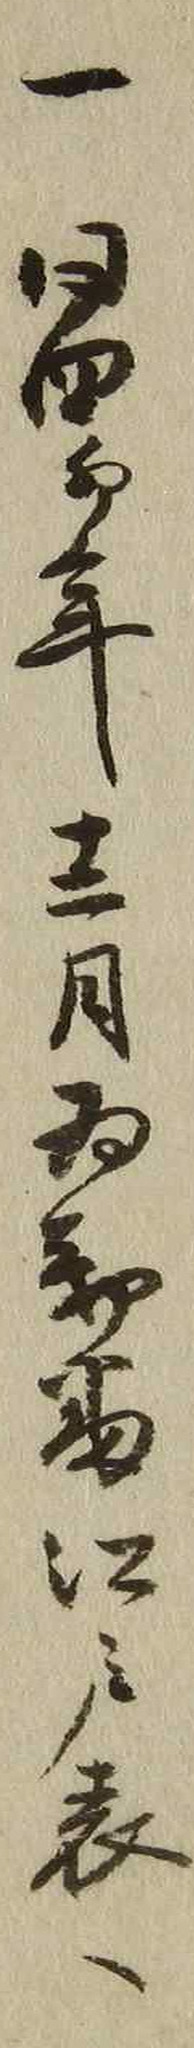一同四卯年十二月為勤番江戸表へ
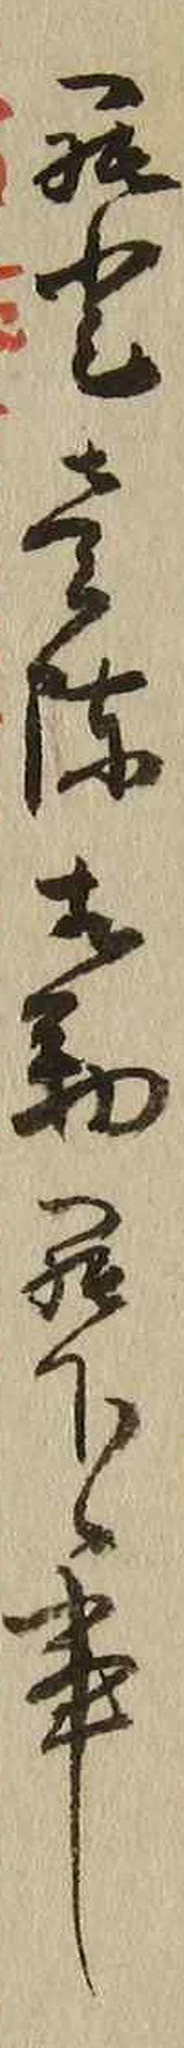罷登壱陣相勤罷下候事
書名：諸士系譜　巻之232　け之部1
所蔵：会津若松市立会津図書館
